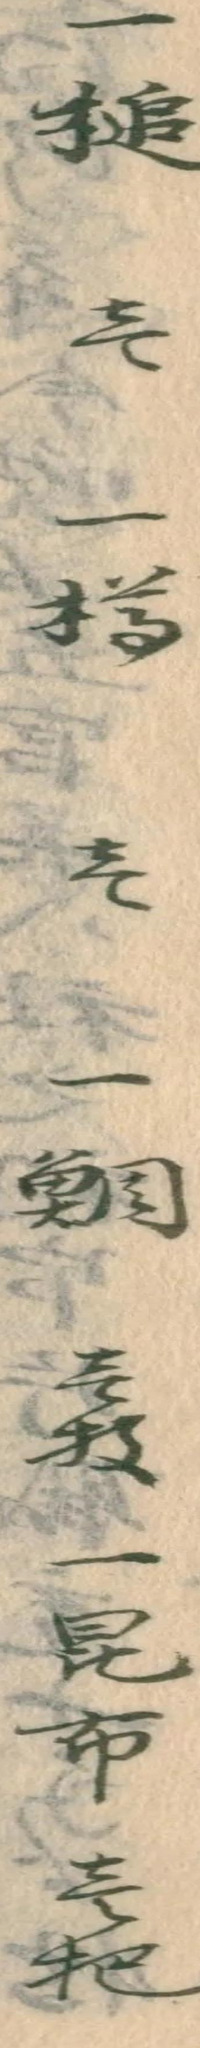一槌壱一樽壱一鯛壱枚一昆布壱把
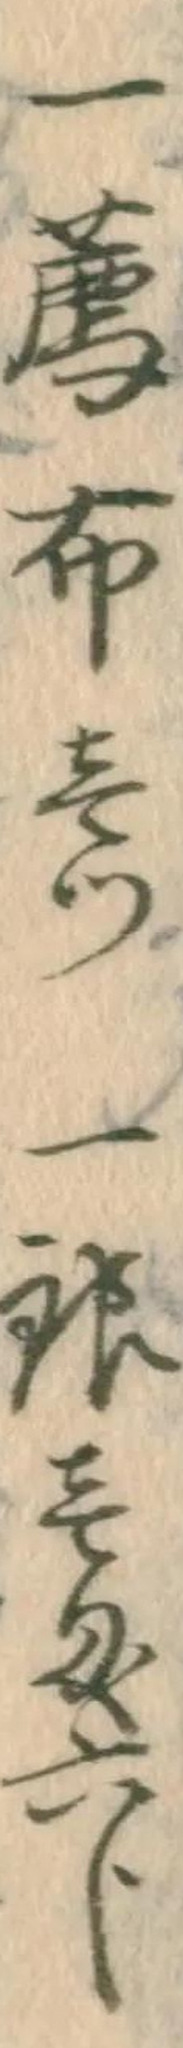一薦布壱一銀壱匁六分
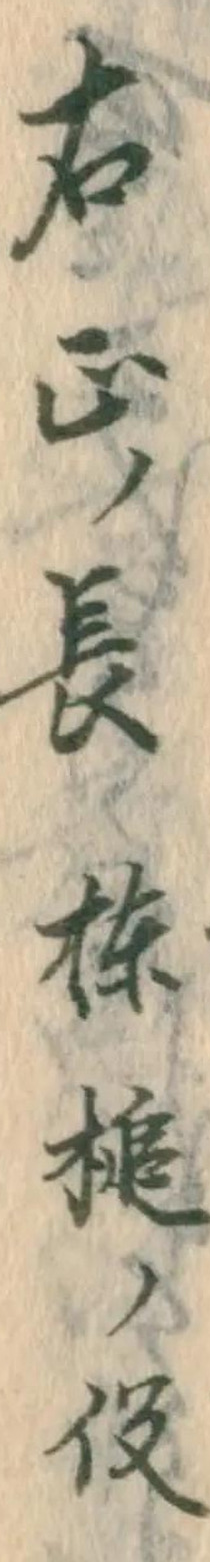右正ノ長棟槌ノ役
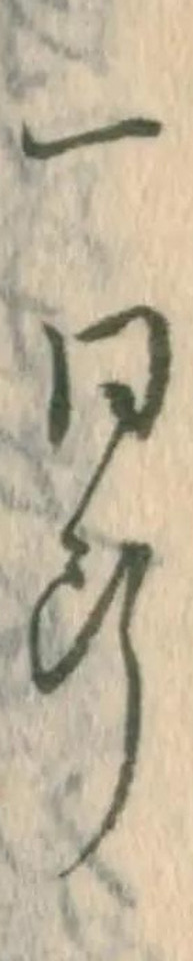一同断
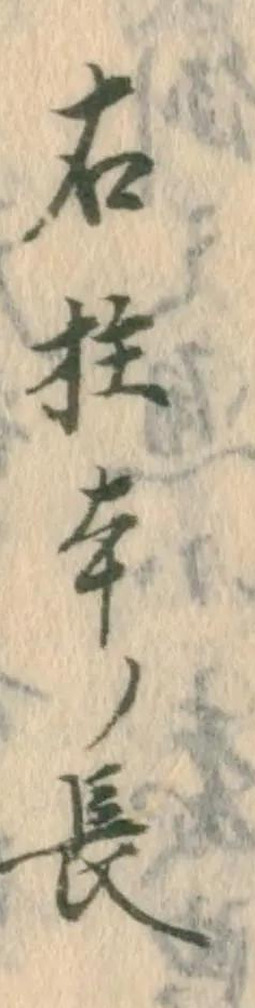右柱本ノ長
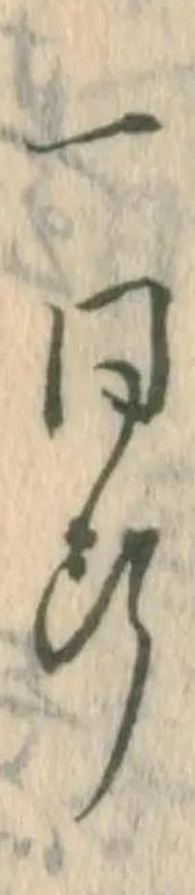一同断
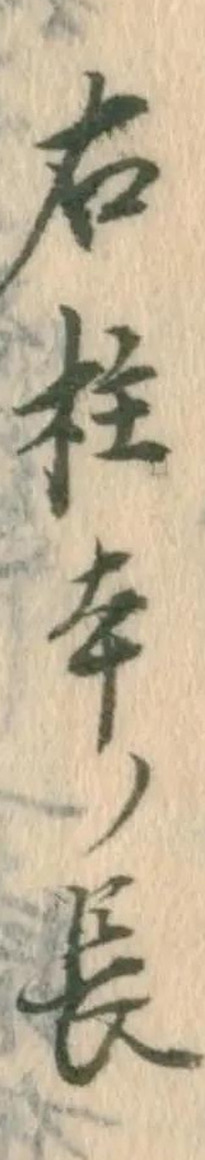右柱本ノ長
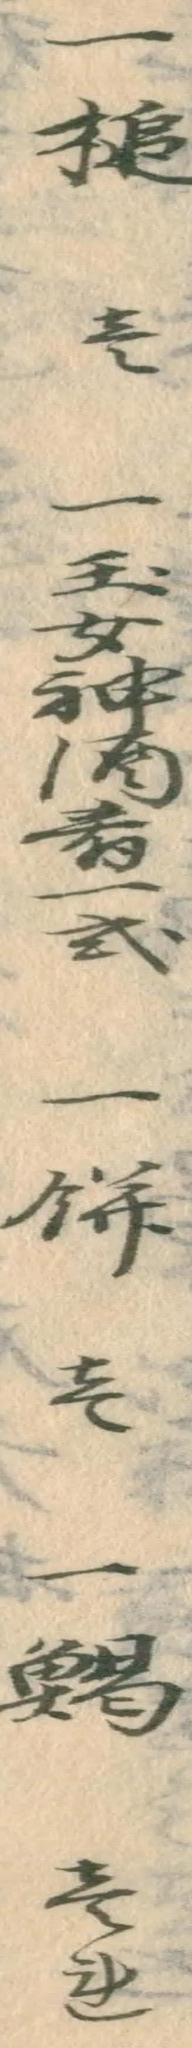一槌壱一玉女神酒肴一式一餅壱一鯣壱連
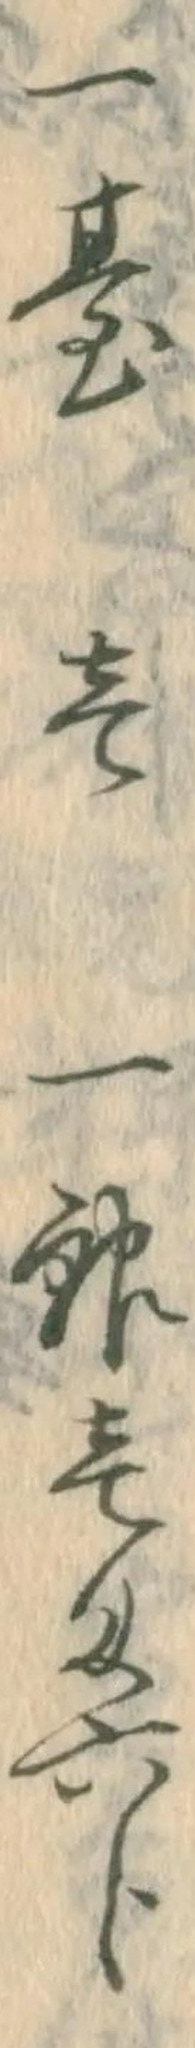一台壱一銀壱匁六分
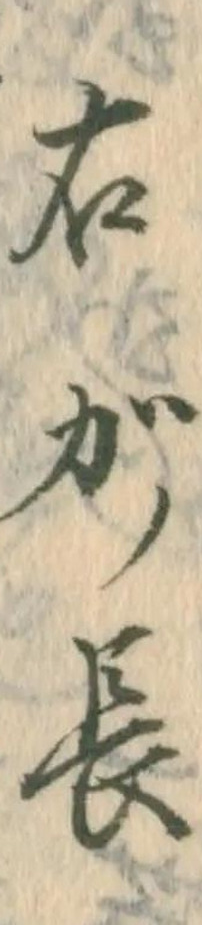右加ノ長
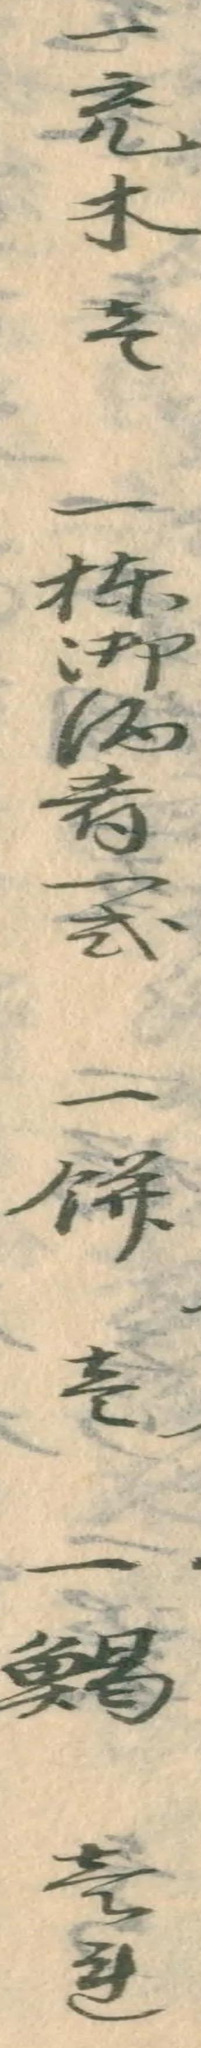一充木壱一棟御酒肴一式一餅壱一鯣壱連
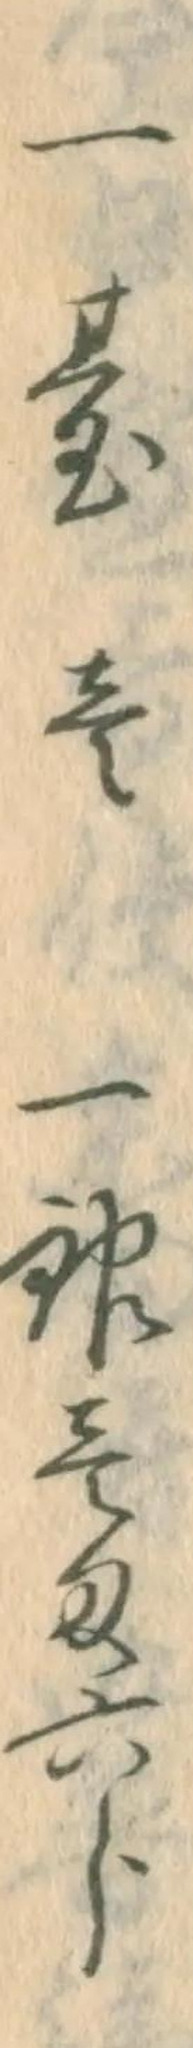一台壱一銀壱匁六分

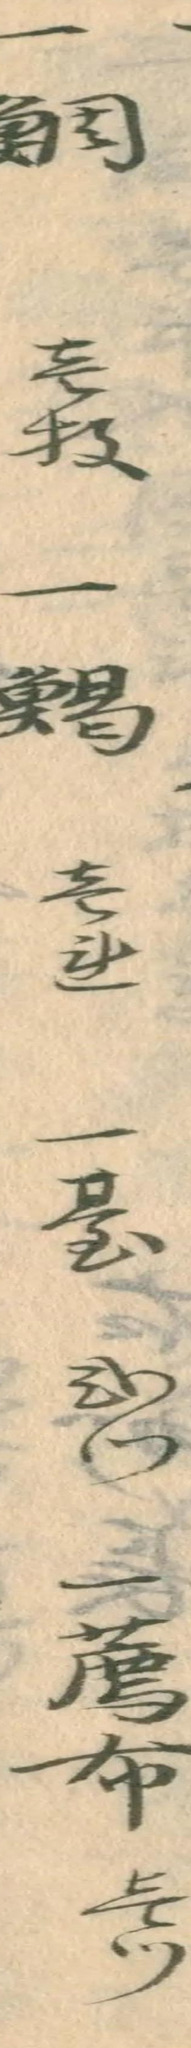一鯛壱枚一鯣壱連一台弐ツ一薦布壱ツ
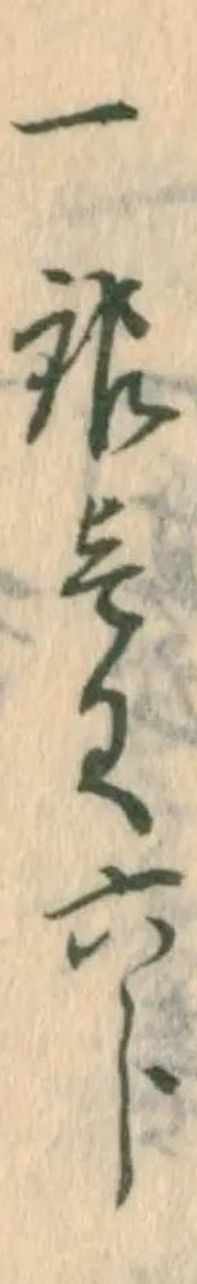一銀壱匁六分
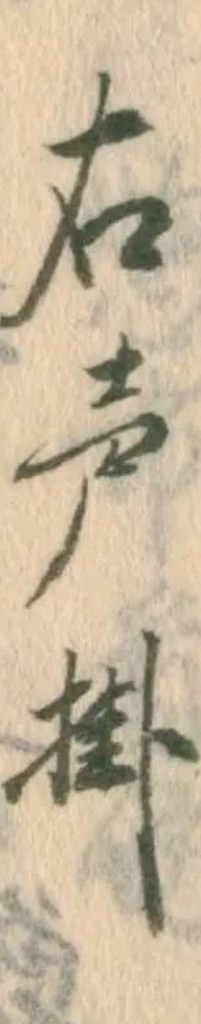右声掛
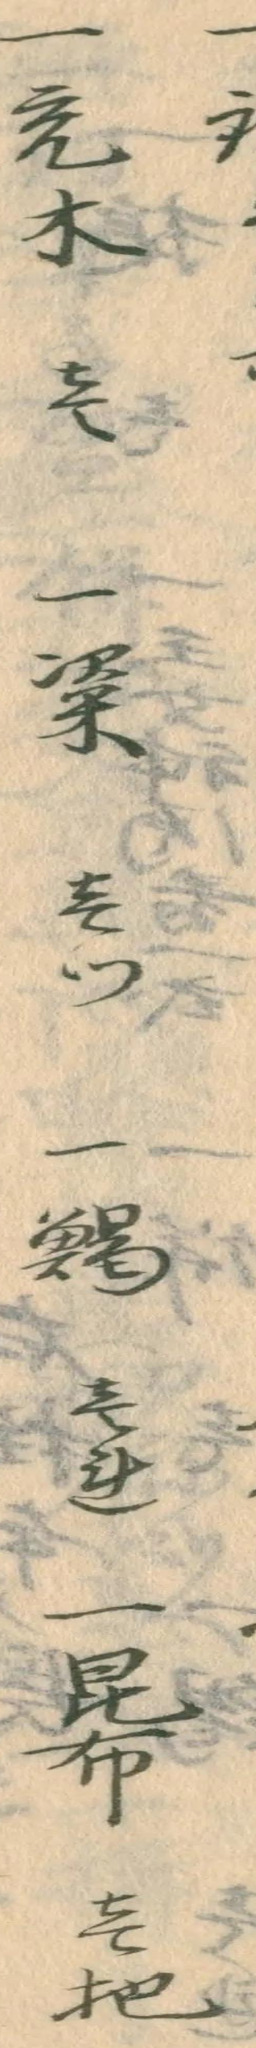一充木壱一粢壱ツ一鯣壱連一昆布壱把
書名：賀茂社記録. 第17冊
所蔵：国立国会図書館 National Diet Library, JAPAN
